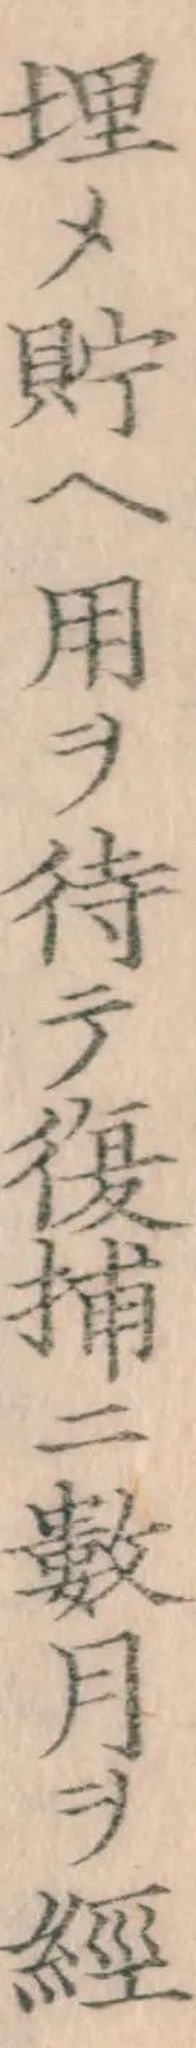埋メ貯ヘ用ヲ待テ復捕ニ数月ヲ経
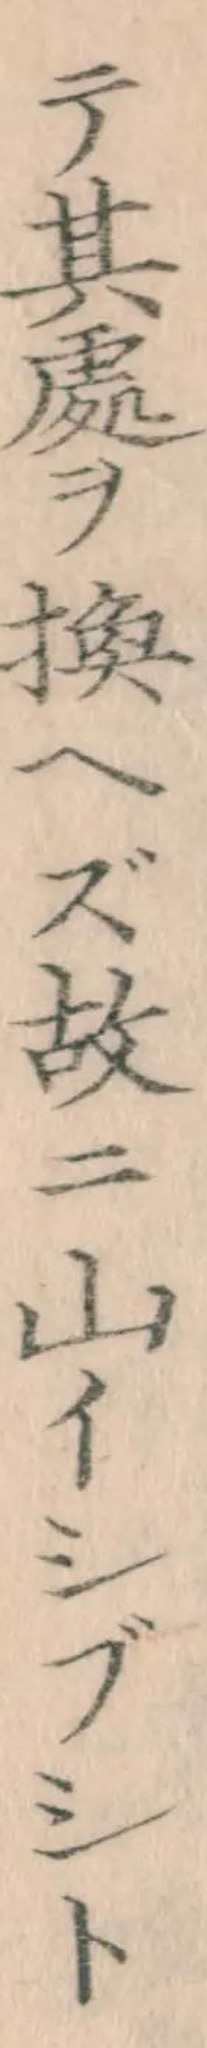テ其処ヲ換ヘズ故ニ山イシブシト
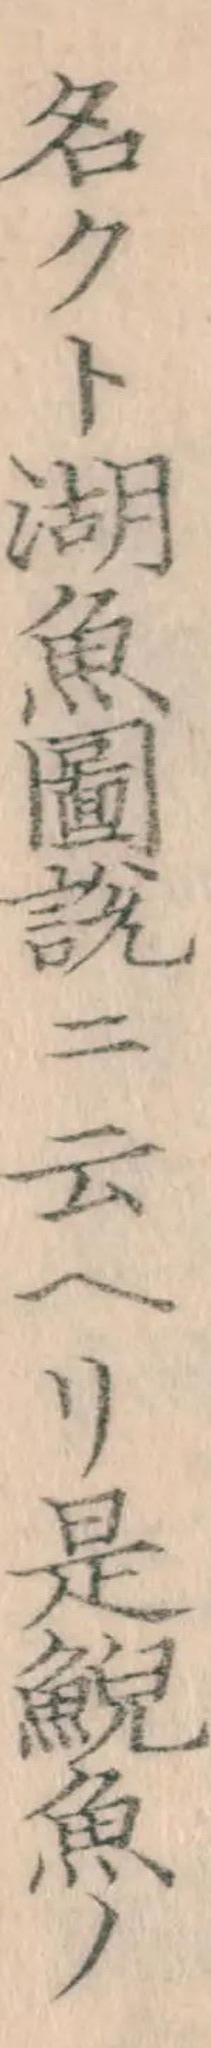名クト湖魚図説ニ云ヘリ是鯢魚ノ
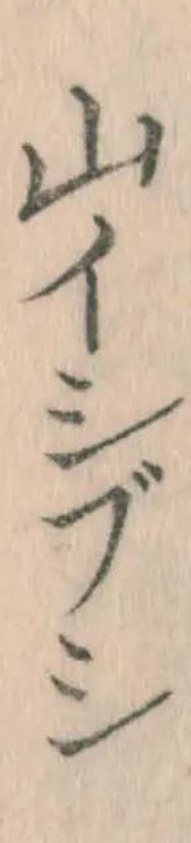山イシブシ
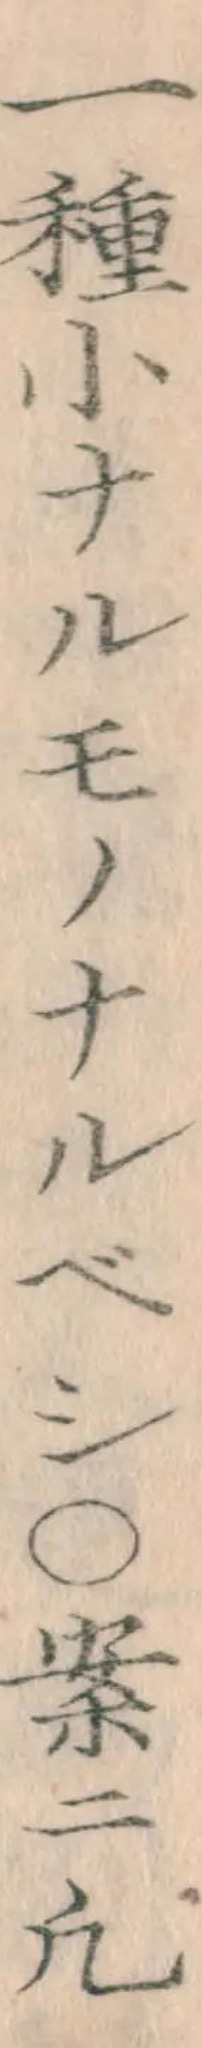一種小ナルモノナルベシ〇案ニ凡
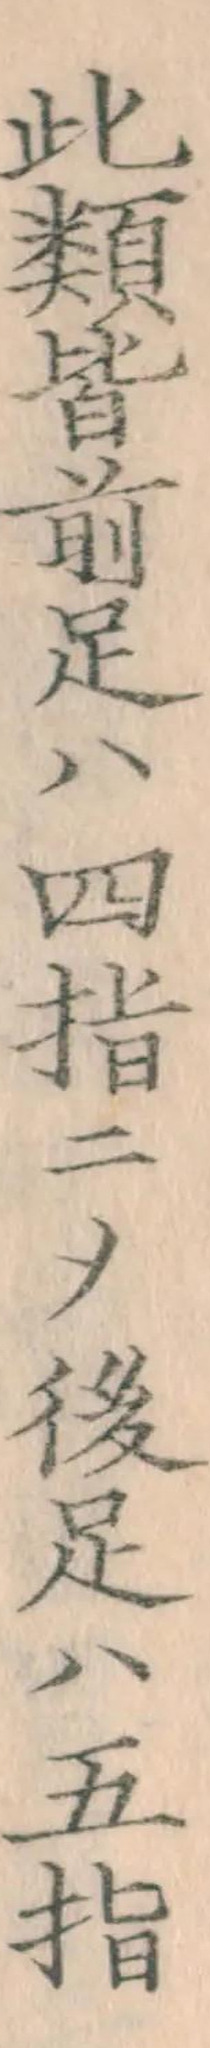此類皆前足ハ四指ニシテ後足ハ五指
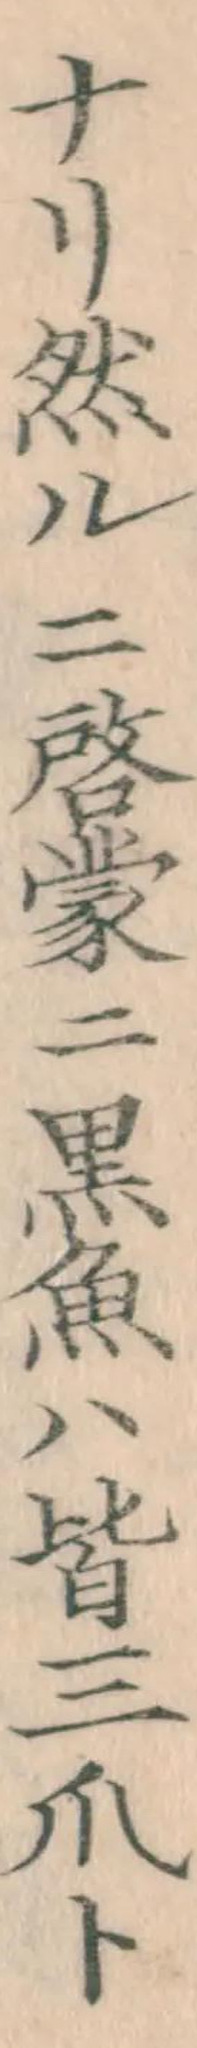ナリ然ルニ啓蒙ニ黒魚ハ皆三爪ト
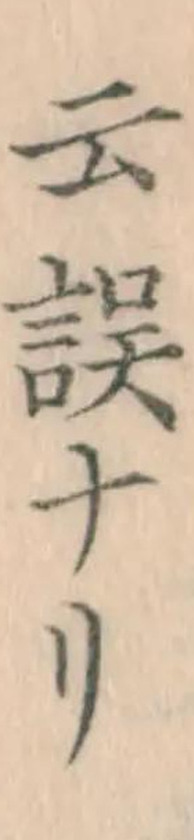云誤ナリ

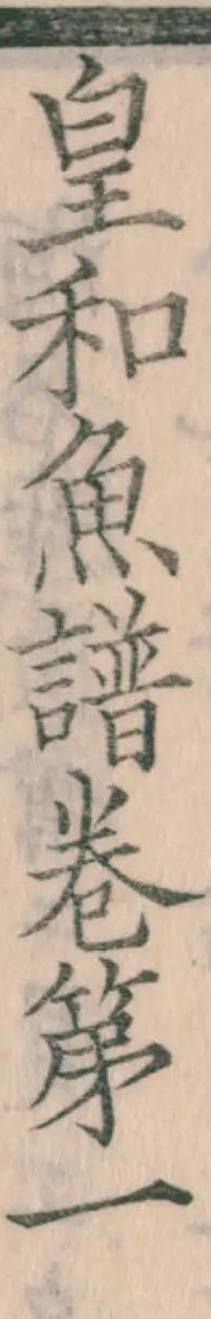皇和魚譜巻第一
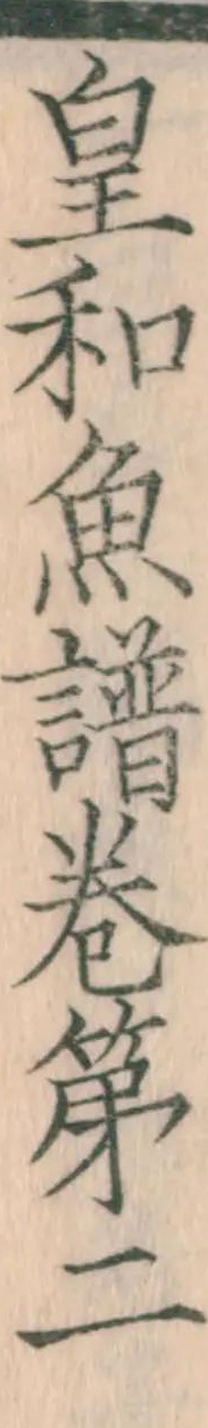皇和魚譜巻第二
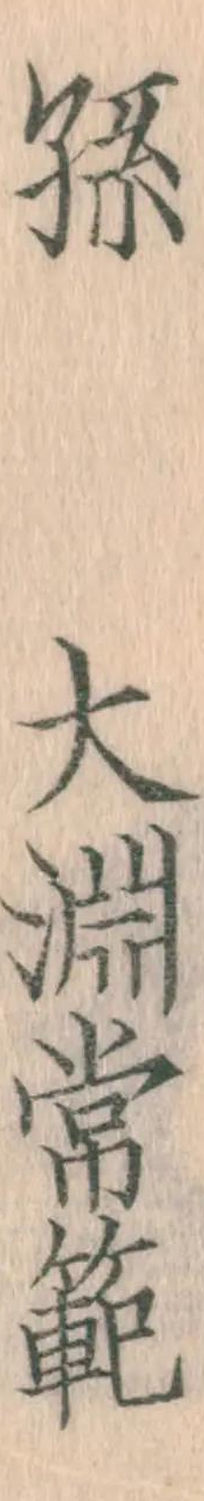孫大淵常範
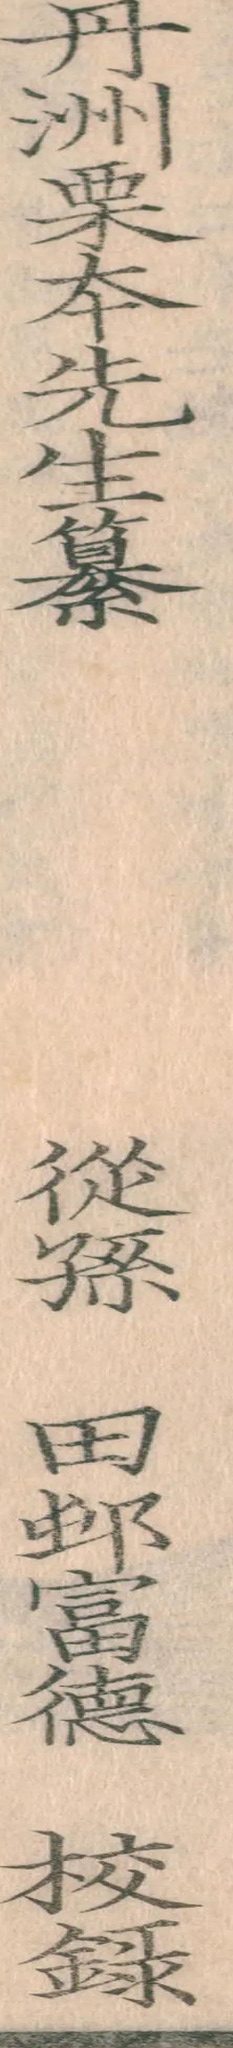丹洲栗本先生纂従孫田村富徳校録
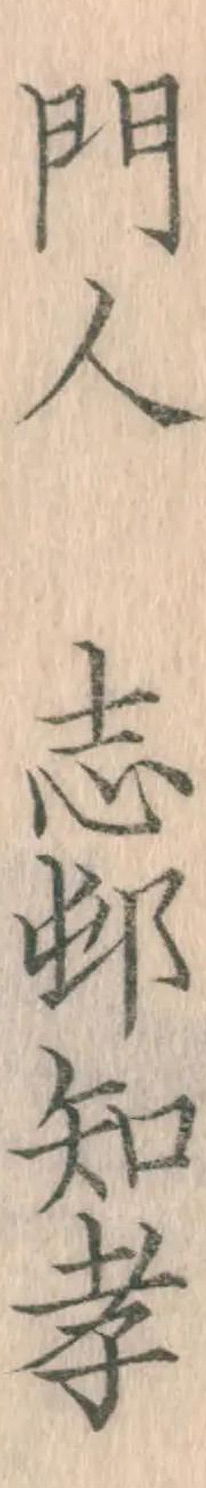門人志村知孝
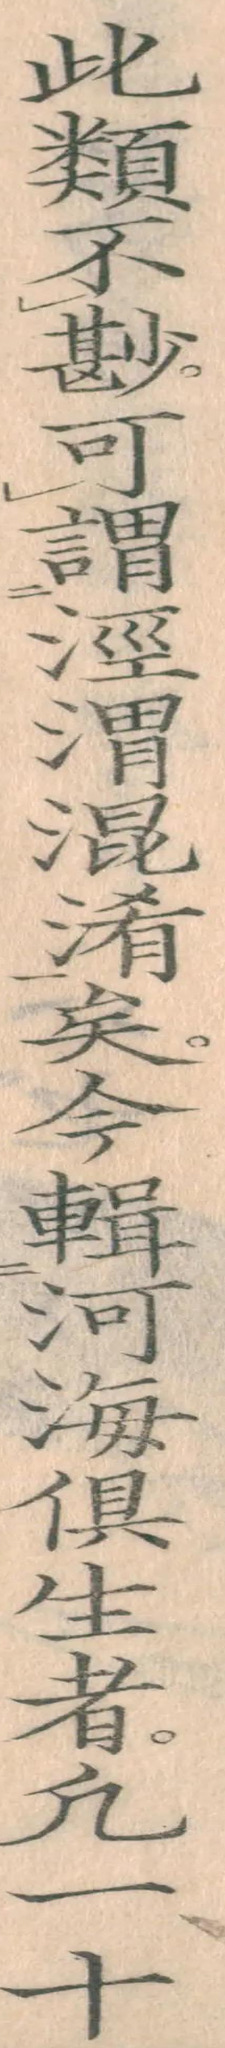此類不尠。可謂涇渭混淆矣。今輯河海俱生者。凡一十

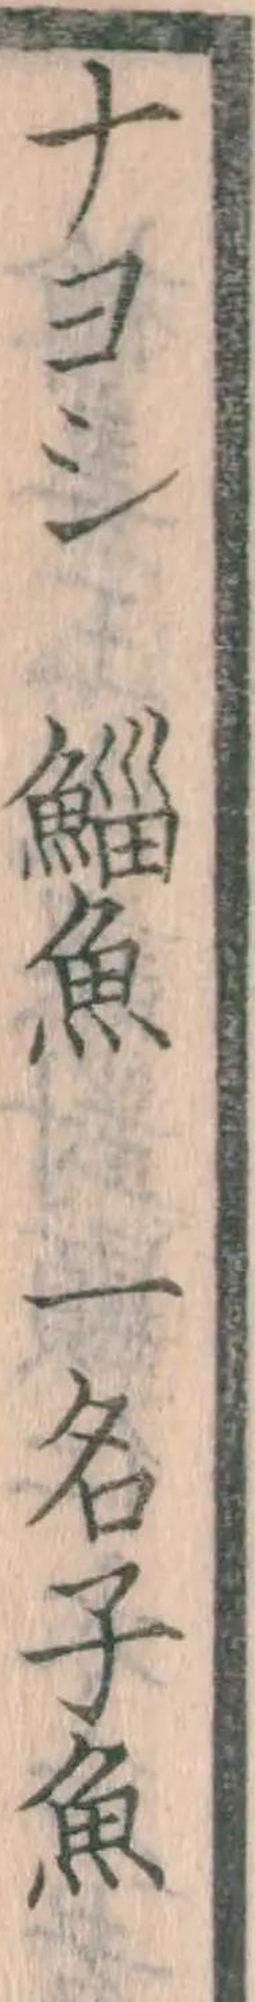ナヨシ鯔魚一名子魚
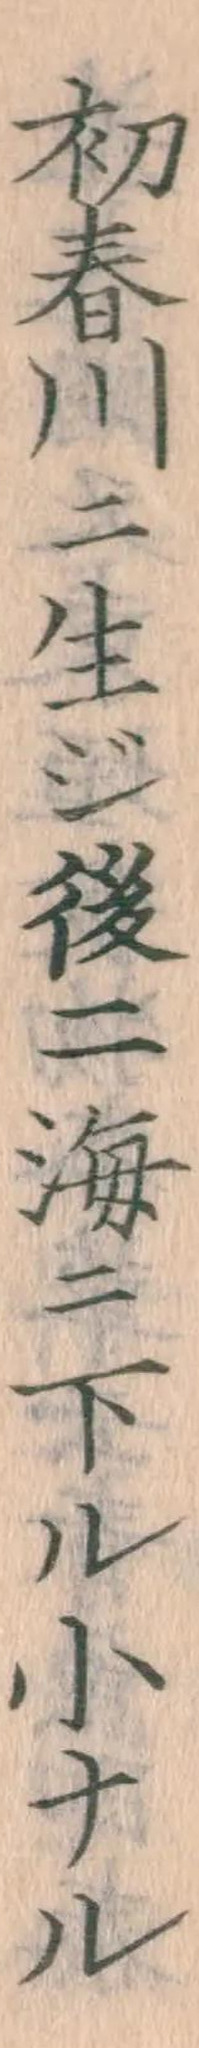初春川ニ生ジ後ニ海ニ下ル小ナル
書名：皇和魚譜 2巻
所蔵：国立国会図書館 National Diet Library, JAPAN
